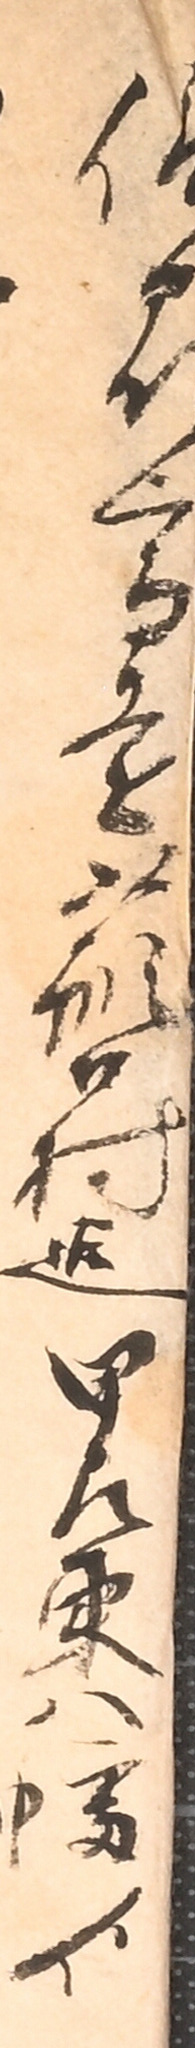信州高遠荊口村迄甲州東八幡ゟ
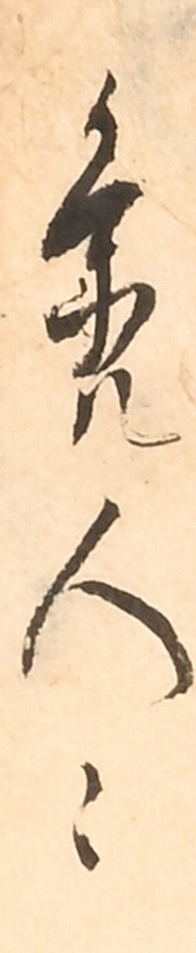参ル人々
